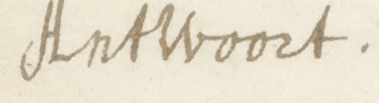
Antwoort.
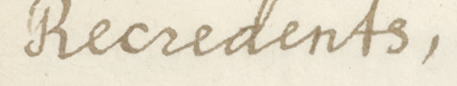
Recredents,
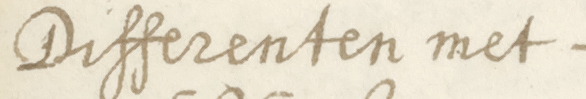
Differenten met -
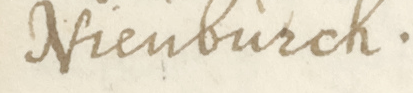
Nieuburch.
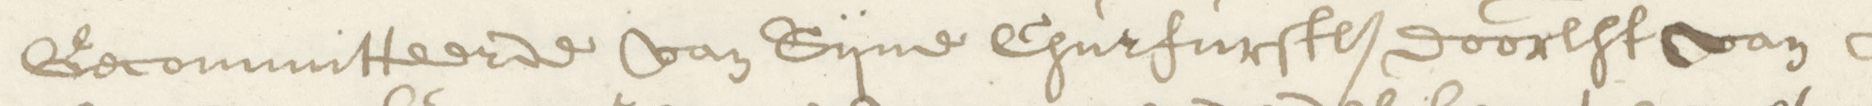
Gecommitteerde van Sijne Churfurstl Doorlht van -
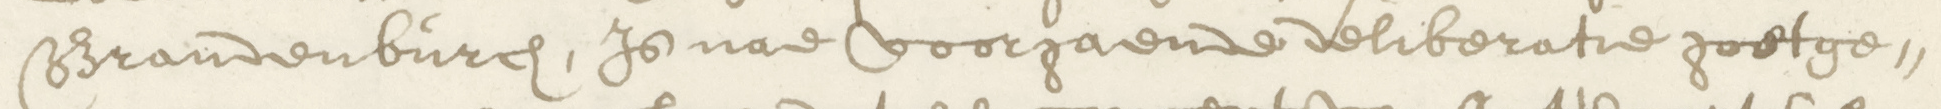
Brandenburch, Is nae voorgaende deliberatie goetge„
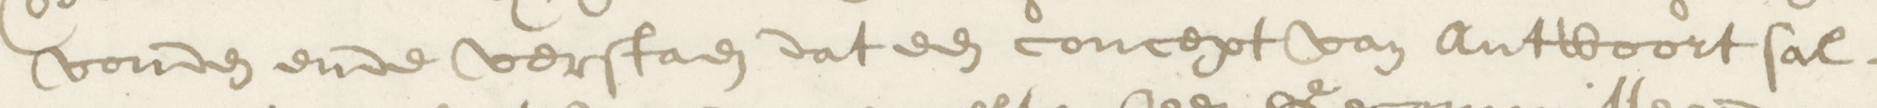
vonden ende verstaen dat een concept van antwoort sal
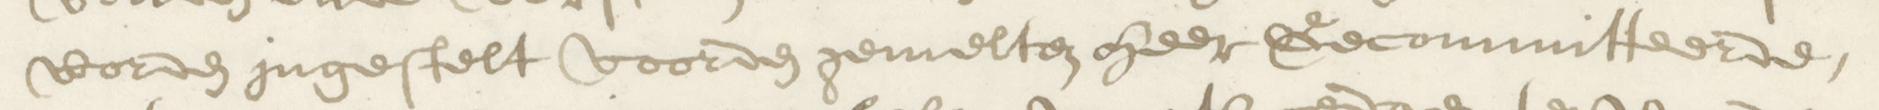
worden ingestelt voorden gemelten heer Gecommitteerde,
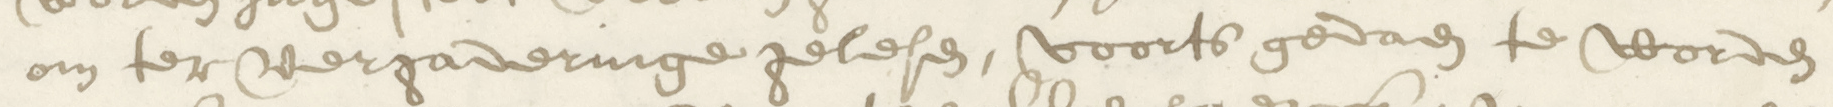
om ter Vergaderinge gelesen, voorts gedaen te worden -
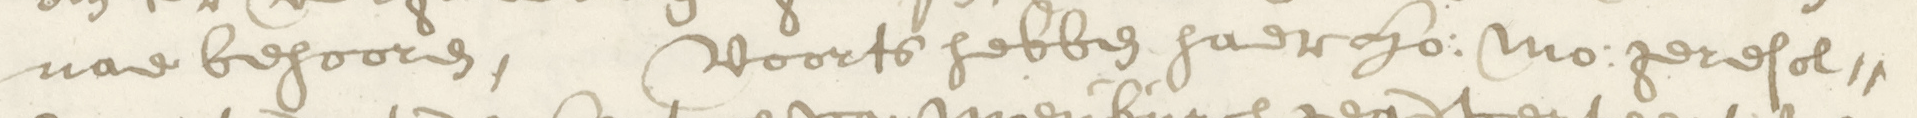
nae behooren. Voorts hebben haer Ho:Mo: geresol„
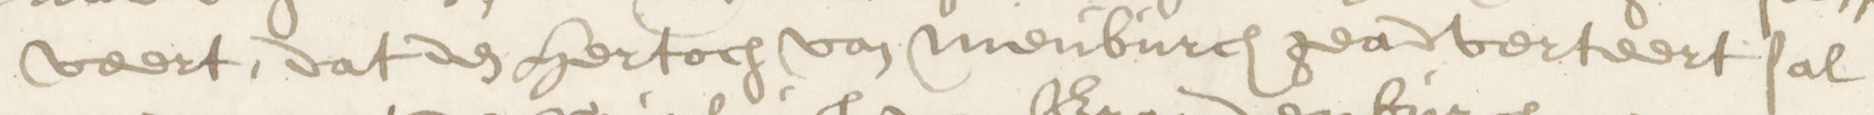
veert, dat den hertoch van Nieuburch geadverteert sal
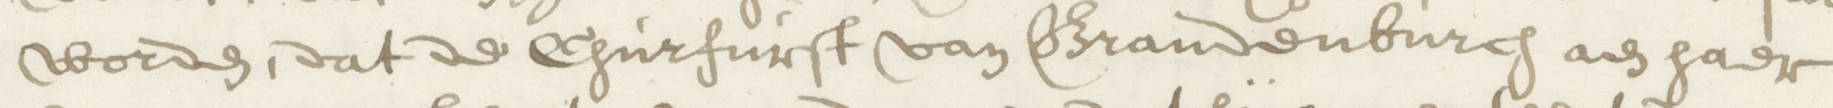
worden, dat de Churfurst van Brandenburch aen haer
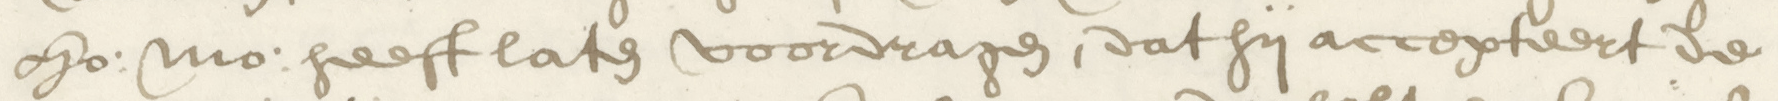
Ho:Mo: heeft laten voordragen, dat hij accepteert de —
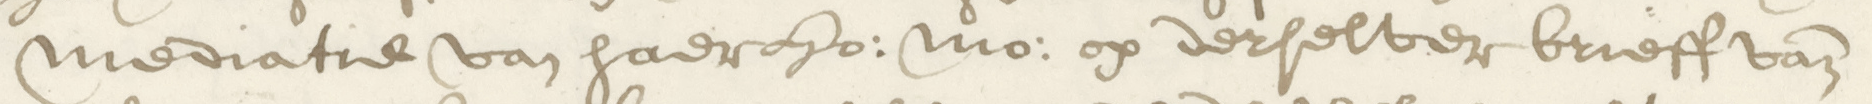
mediatie van haer Ho:Mo: op derselver brieff van
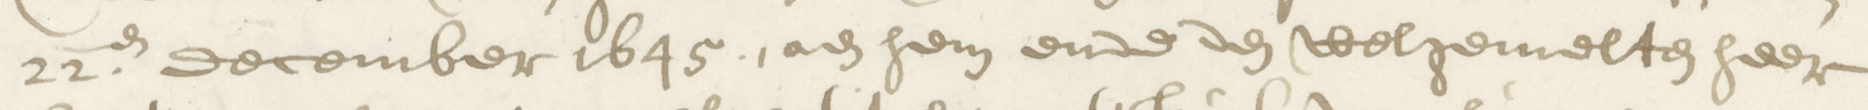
22en. December 1645, aen hem ende den welgemelten heer
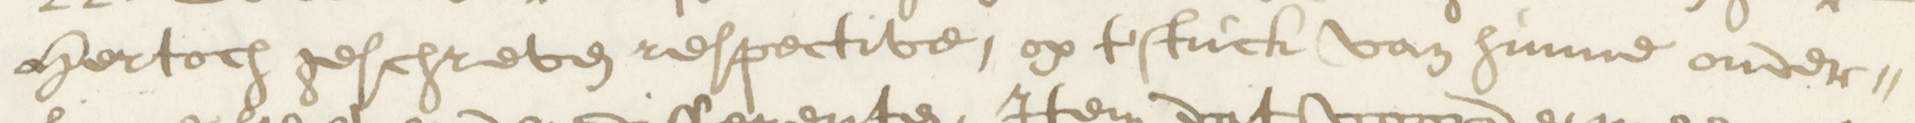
hertoch geschreven respective, op t'stuck van hunne onder„
